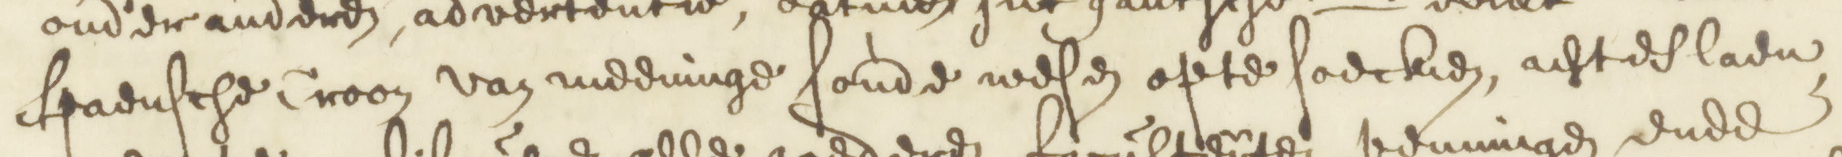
spaensche Croon van meeninge soude wesen opte soecken, aen te slaen,
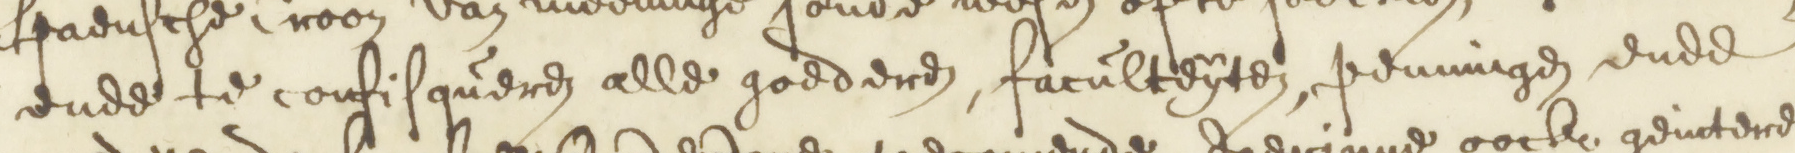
ende te confisqueren alle goederen, faculteijten, penningen ende
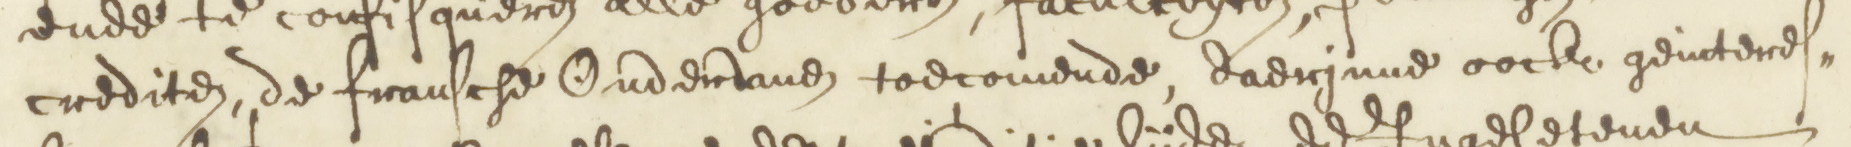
crediten, de fransche Onderdanen toecomende, daerinne oock geinteres„
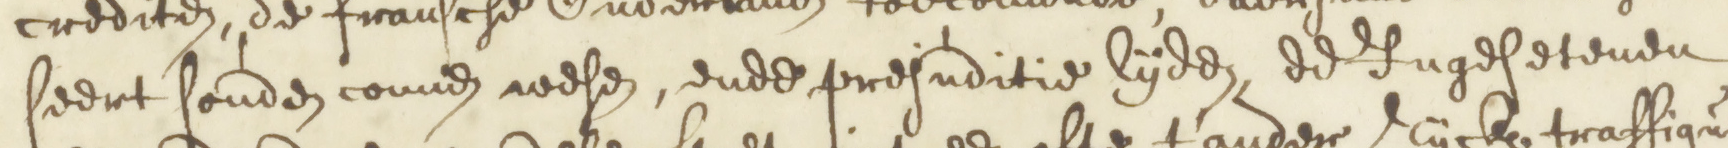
seert souden connen wesen, ende prejuditie lijden de Ingesetenen
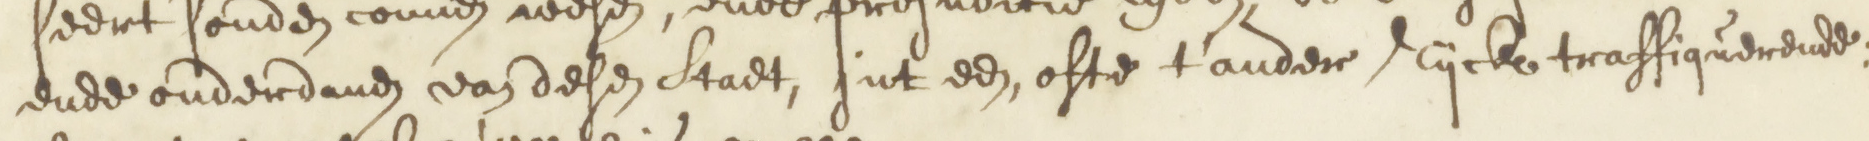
ende onderdanen van desen Staet, int een, ofte t'ander Rijck traffiquerende:
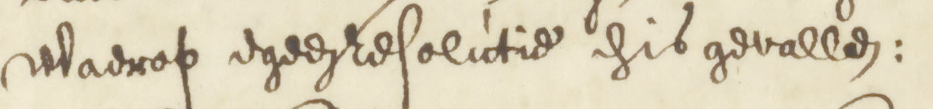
Waerop egeen resolutie en is gevallen:
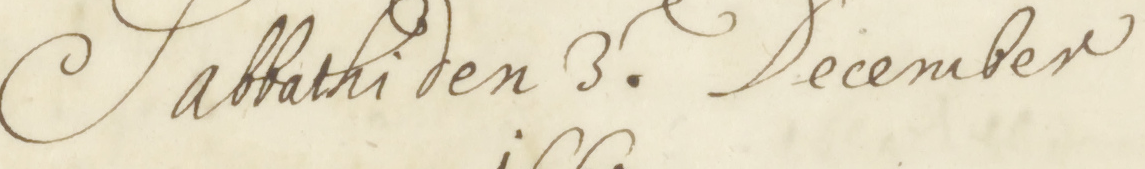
Sabbathi den 3e. December
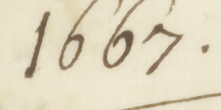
1667.
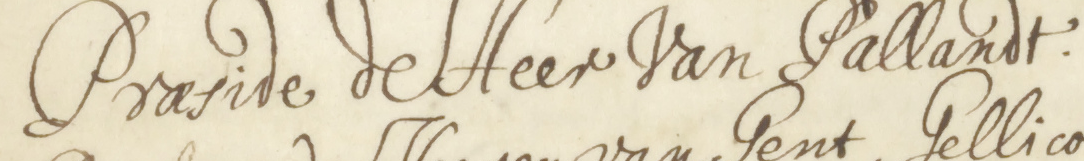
Præaside de Heer van Pallandt.
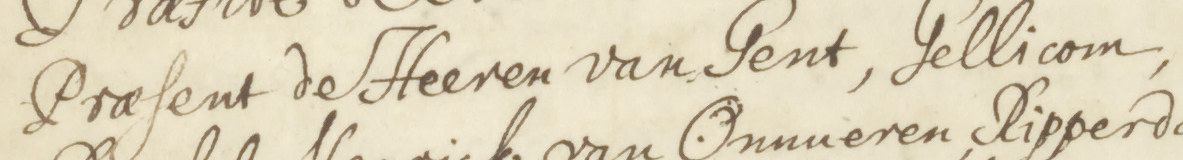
Præsent de Heeren van Gent, Gellicom,
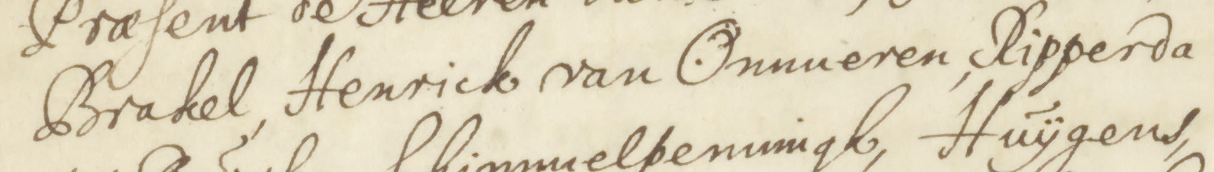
Brakel, Henrick van Ommeren, Ripperda
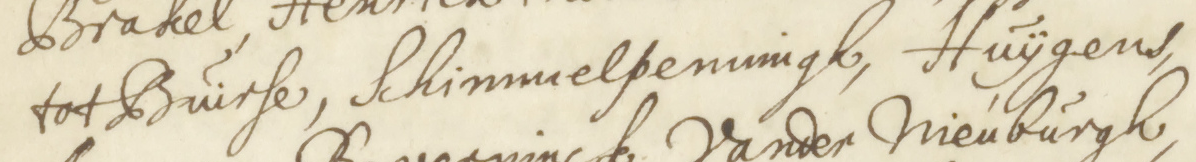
tot Buirse, Schimmelpenningh, Huijgens,
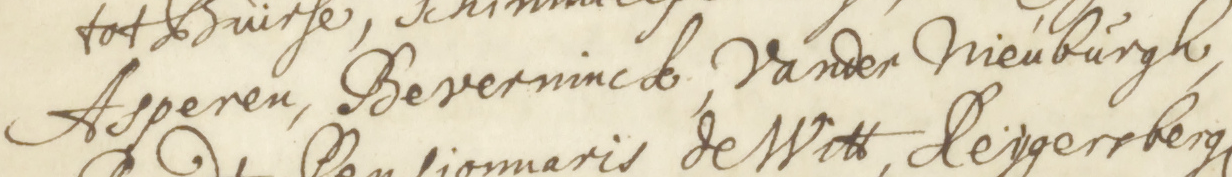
Asperen, Beverninck, vander Nieuburgh,
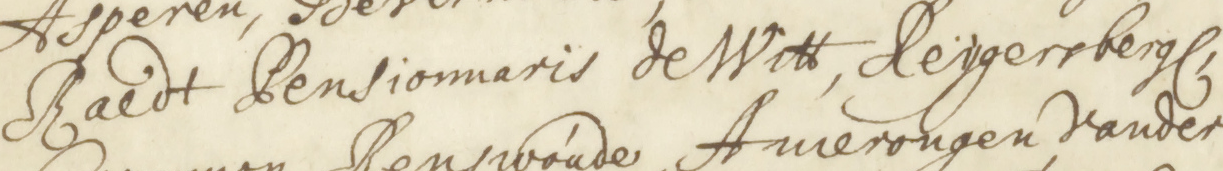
Raedt Pensionnaris de Witt, Reijgersbergh,
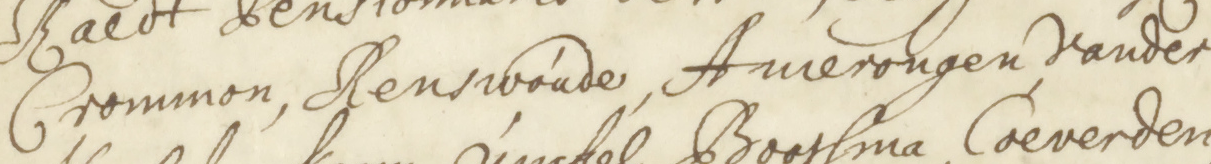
Crommon, Renswoude, Amerongen, vander
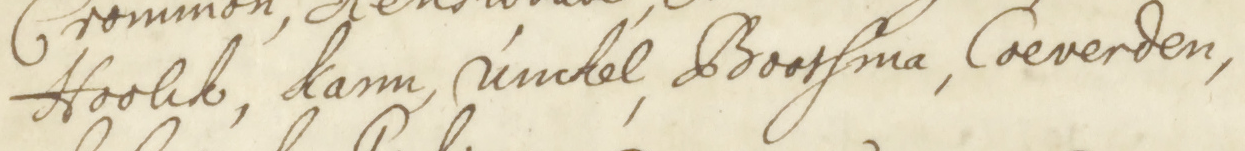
Hoolck, Kann, Unckel, Bootsma, Coeverden,
